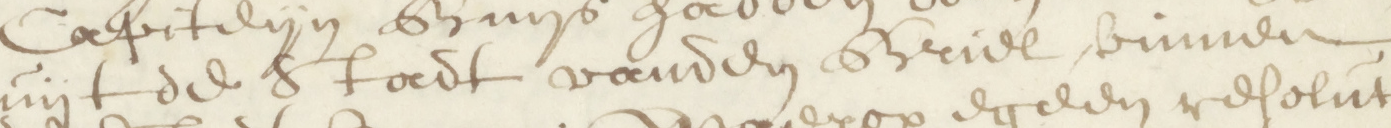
uijt de Stadt vanden Briel, binnen
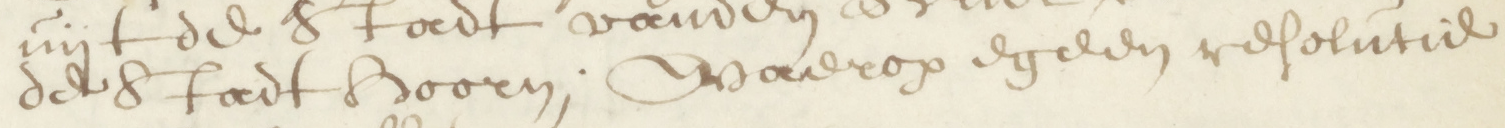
de Stadt Hoorn; Waerop egeen resolutie
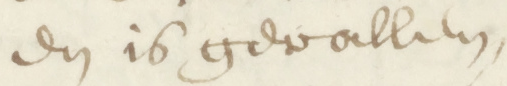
en is gevallen.
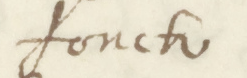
Fonck
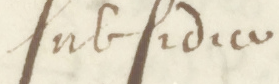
subsidie
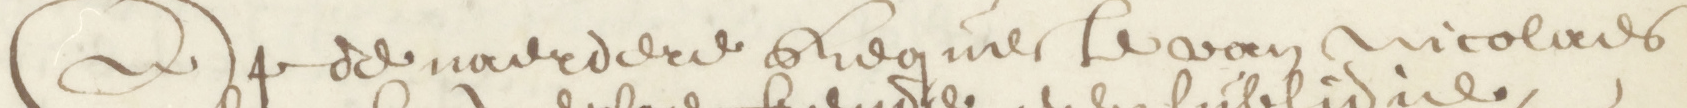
Opde naerdere Requeste van Nicolaes
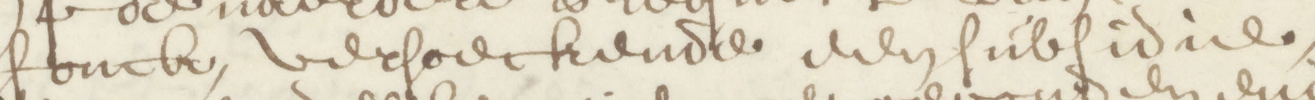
Fonck, versoeckende een subsidie,
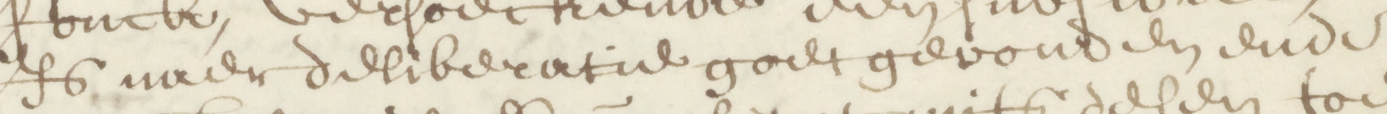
Is naer deliberatie goetgevonden ende
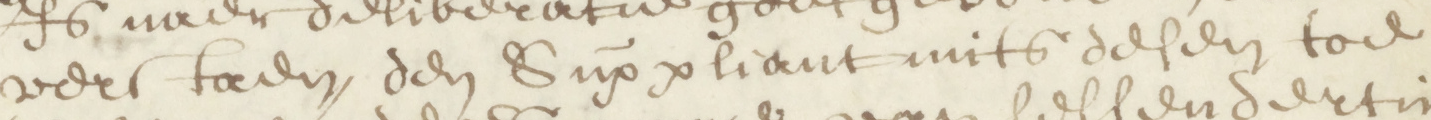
verstaen, den Suppliant mits desen toe
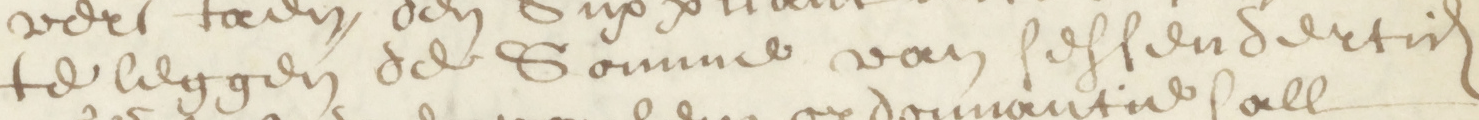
te leggen de Somme van sessendertich
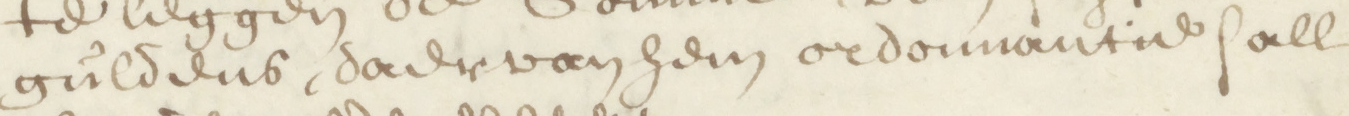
guldens, daervan hem ordonnantie sall
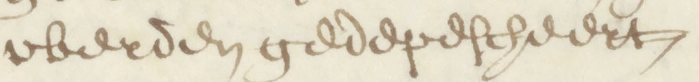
werden gedepescheert.
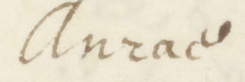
Anrae
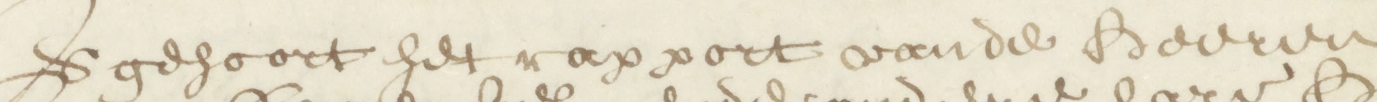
Is gehoort het rapport vande Heeren
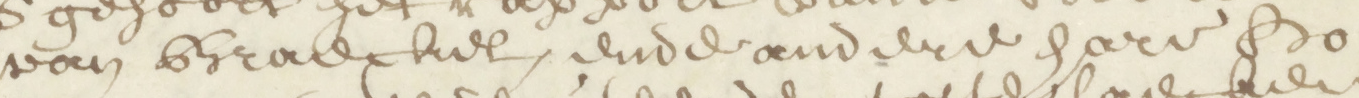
van Braeckel, ende andere hare Ho:
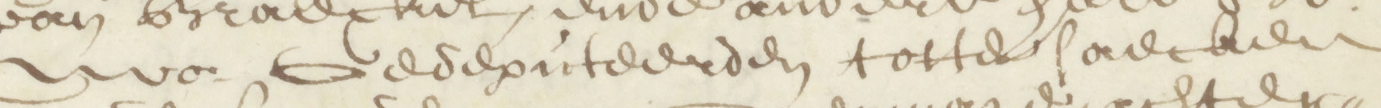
Mo: Gedeputeerden totte saecken
